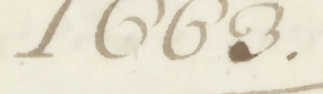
1663.
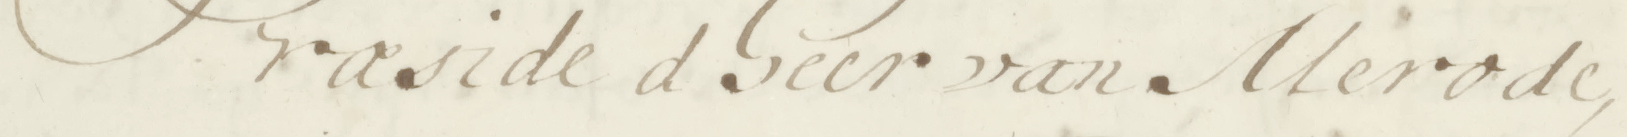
Præside d heer van Merode,
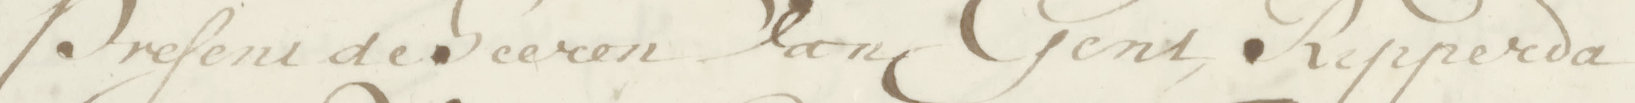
Present de Heren Van Gent, Ripperda
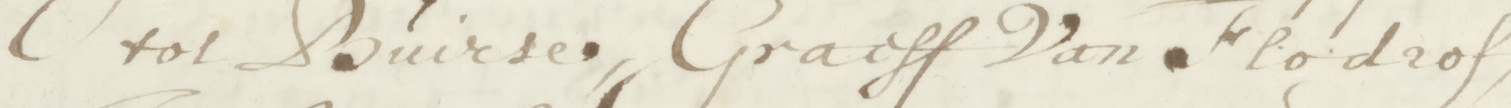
tot Buirse, Graeff Van Flodrof,
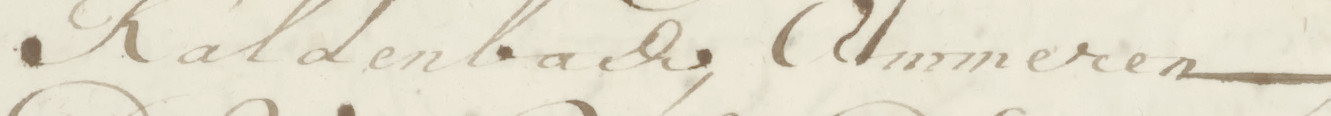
Kaldenbach, Ommeren
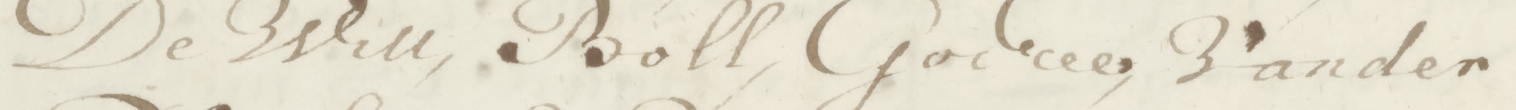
De Witt, Boll Goeree, Vander
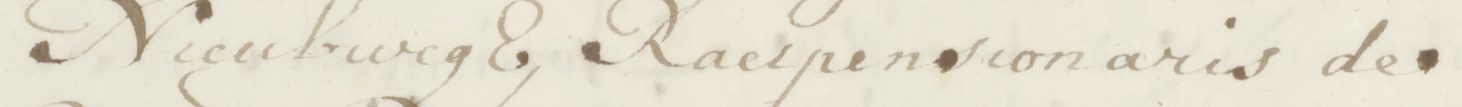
Nieuburgh, Raetpensionaris de
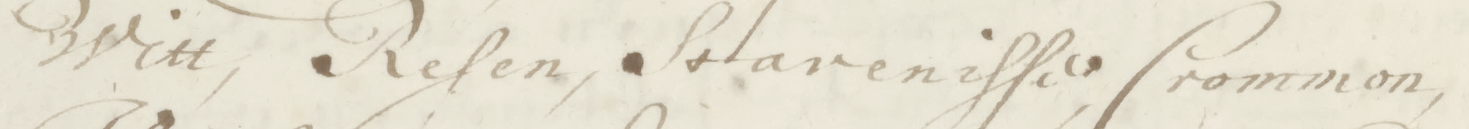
Witt, Resen, Stavenisse, Crommon,
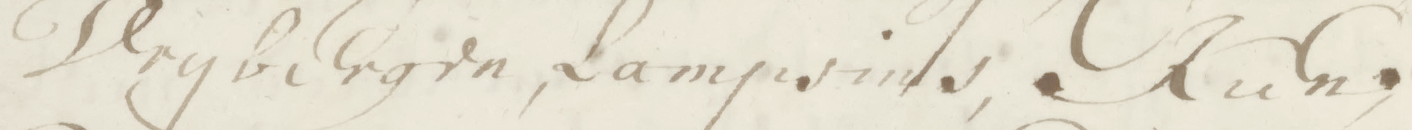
Vrybergen, Lampsins, Kan,
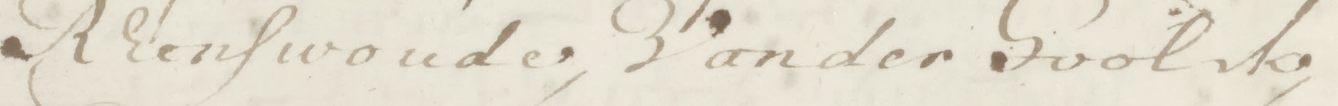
Rhenswoude, van der Hoolck
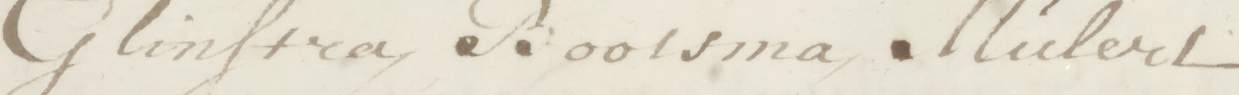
Glinstra, Bootsma, Mulert
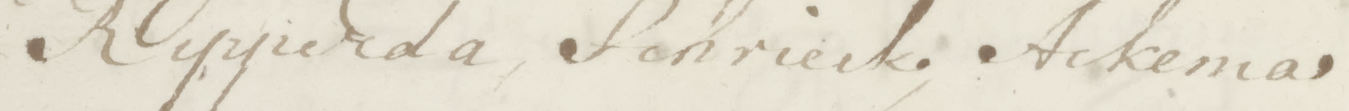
Ripperda, Schrieck, Ackema
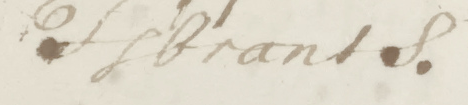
Isbrants.
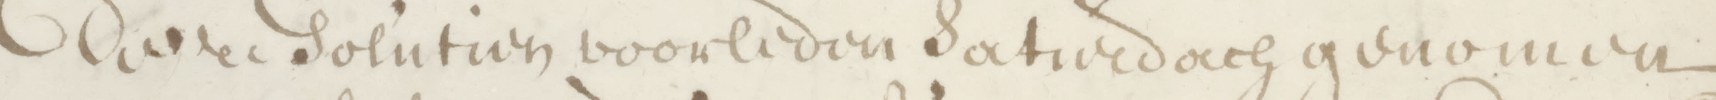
De resolutien voorleden saturdach genomen
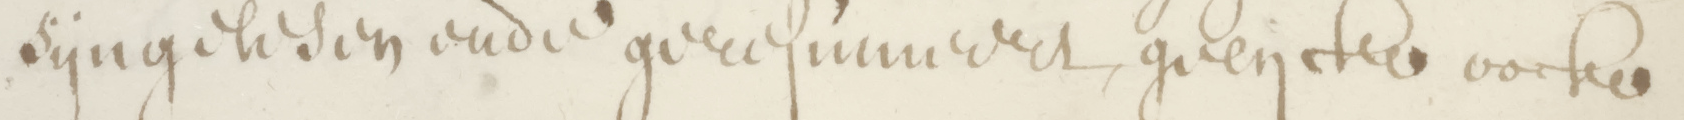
sijn gelesen ende geresumeert, gelijcke oock
